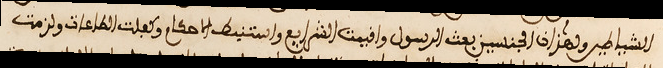الشياطين ولهذان الجنسين بعثه الرسول واقيمت الشرايع واستنيط الاحكام وكفلت الطاعات ولزمت
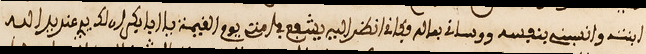ابنته وانسبنى بنفسه ووسانى بماله فكانى انظر اليه يشفع في امتى يوم القيمة يا ابا بكر ان لك يدي عند يد الله
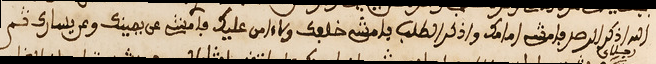الله اذكر الرصد فامشى امامك واذكر الطلب بامشى خلفك ولا ءامن عليك فامشى عن يمينك وعن يسارك ثم
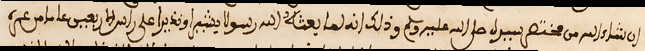ان شاء الله من مختصر سببده صلى الله عليه وسلم وذلك انه لما بعثه الله رسولا يشببرا ونذيرا على راس الاربعين عاما من عمره
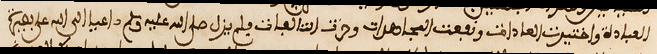العبادة واختيرت العادات ونفعت المجاهدات وحرت التالفات فلم يزل صلى الله عليه وسلم داعيا الى الله على بفبرة
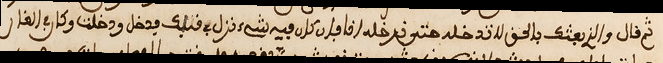ثم قال والذي بعثك بالحق لا تدخله حتى ندخله انا فان كان فيه شىء نزل في قبلك فدخل ودخلت وكان في الغار
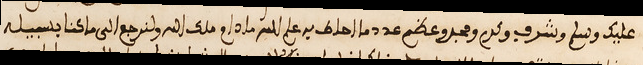عليك وسلم وشرف وكرم ومجد وعظم عدد ما احاط به علم الله ما دام ملك الله ولندجم الى ما كنا بسبيله
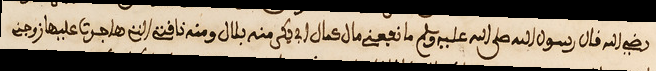رضي الله قال رسول الله صلى الله عليه وسلم ما نفعنى مال كمال ابى يكر منه بلال ومنه ناقتى التى هاجرت عليها زوجنى
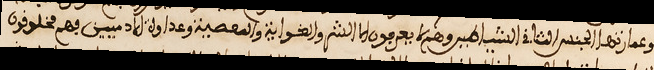وعمارتها الجنس الثانى الشياطين وهم لا يعرفون الا الشر والغراية والمعصية وعداوة الادميين فهم مخلوقون
